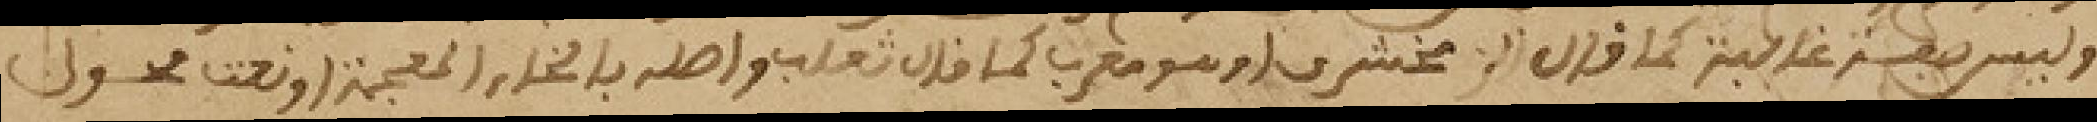وليس صفة غالبة كما قال الزمخشرى وهو معرب كما قال ثعلب واصله بالخاء المعجمة او نعت محول
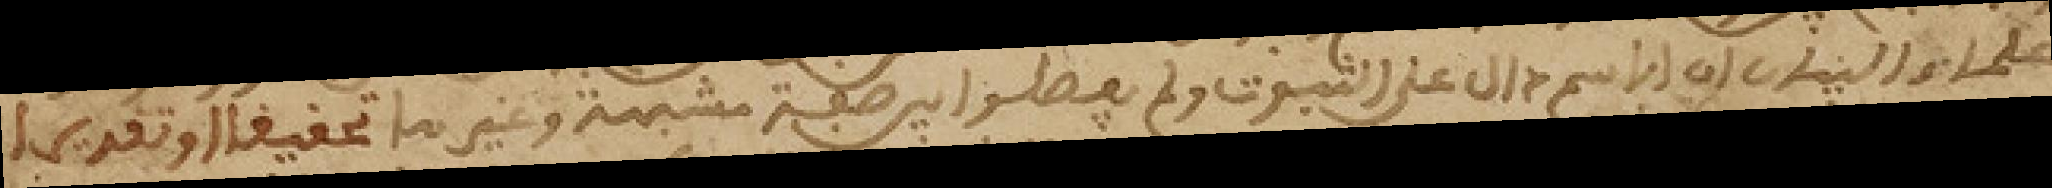علماء البيان ان الاسم دال على الثبوت ولم يفصلوا بين صفة مشبهة وغيرها تحقيقا او تقديرا
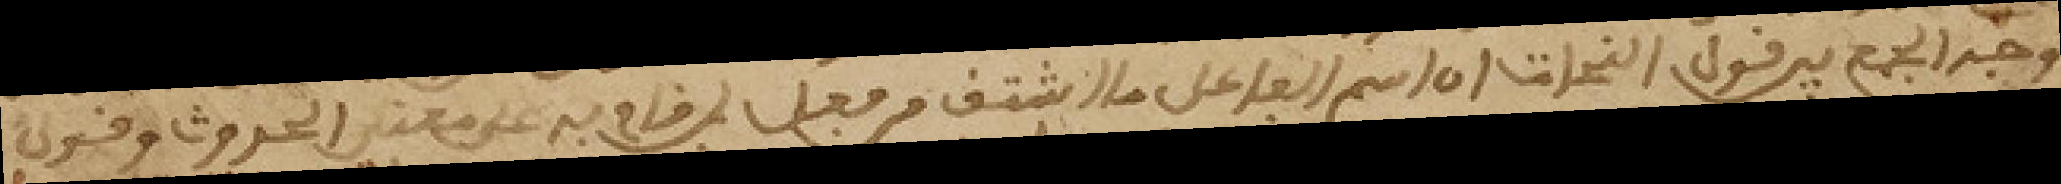وجه الجمع بين قول النحات ان اسم الفاعل ما اشتق من فعل لمن قام به على معنى الحدوث وقول
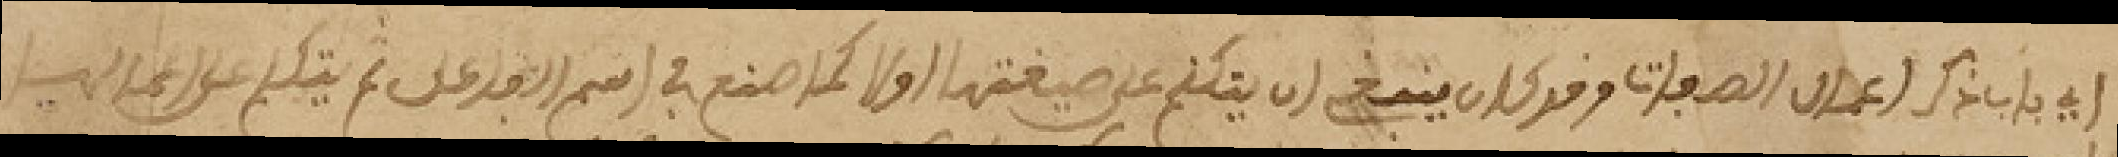اي باب ذكر اعمال الصفات وقد كان ينبغى ان يتكلم على صيغتها اولا كما صنع في اسم الفاعل ثم يتكلم على اعمالها
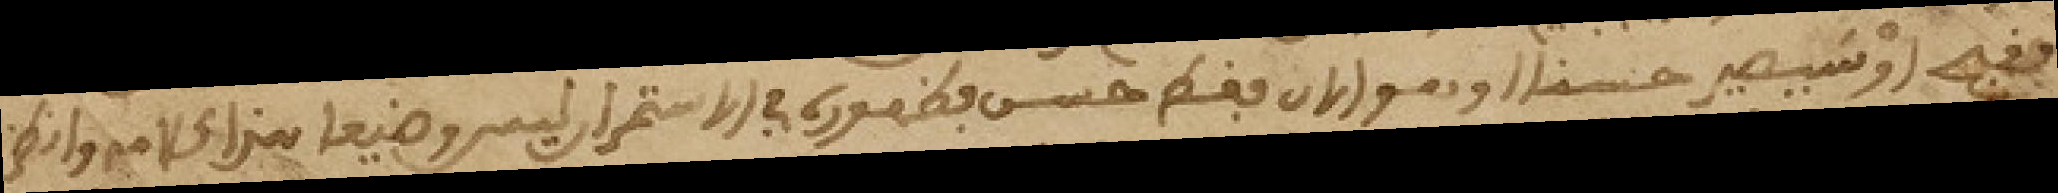فقبح او سيصير حسنا او هو الان فقط حسن فظهوره في الاستمرار ليس وضيعا # ممزا كلامه وانظر
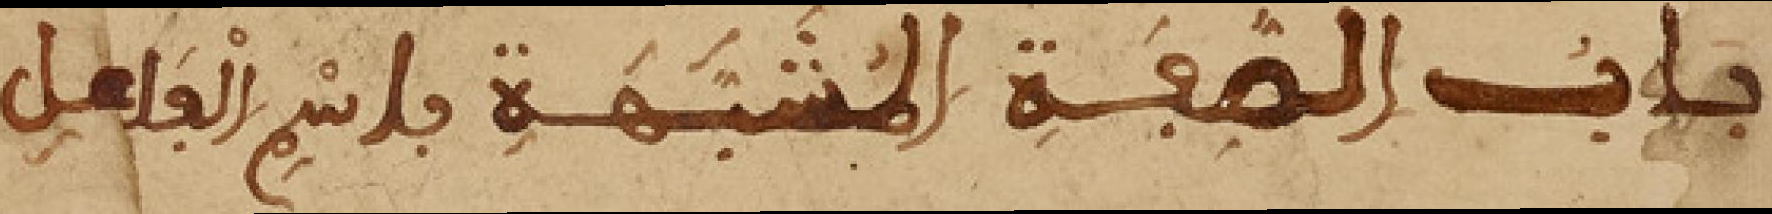باب الصفة المشبهة باسم الفاعل
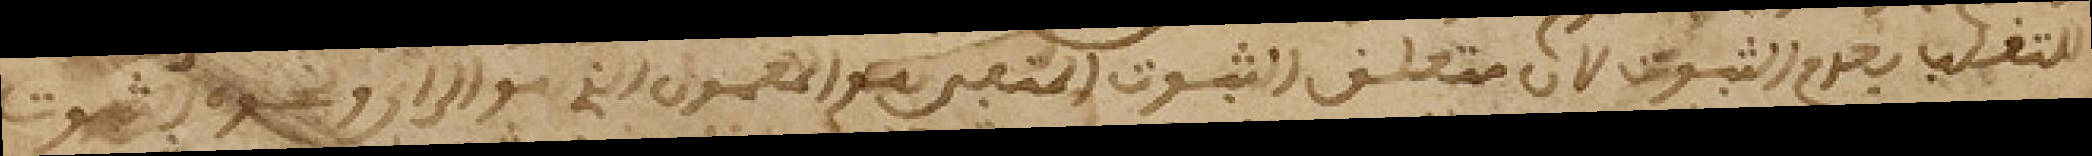للتقلب بعدم الثبوت لان متعلق الثبوت المتفى هو المعمول الذي هو الراى ونحوه الثبوت
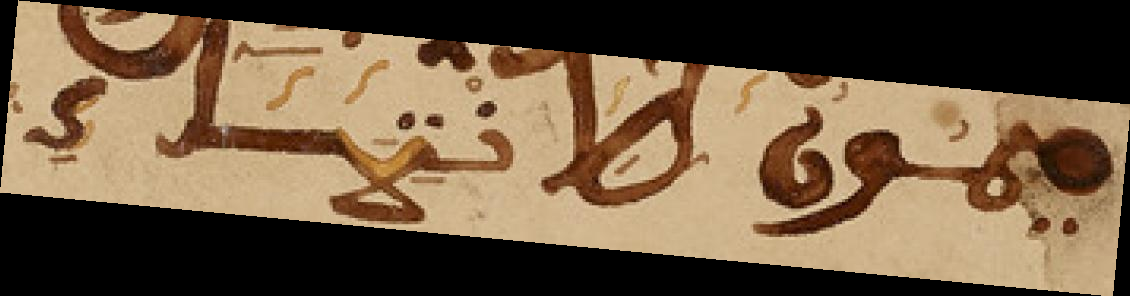ميمون الانتهاء
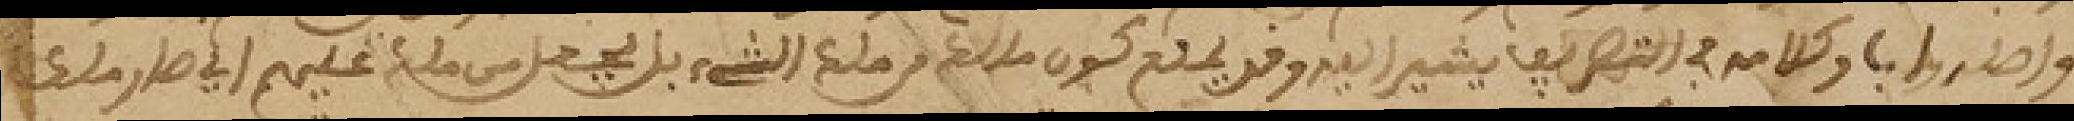واصله راب وكلامه في التصريف يشير اليه وقد يمنع كون مالك من ملك الشىء بل يجعل من ملك عليهم اي صار ملكا
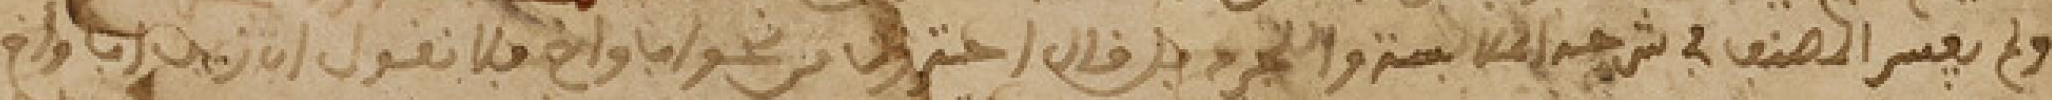ولم يعسر المصنف في شرحه الملابسة والتجرد بل قال احترزوا من نحو اب واخ فلا نقول ان زيد اب واخ
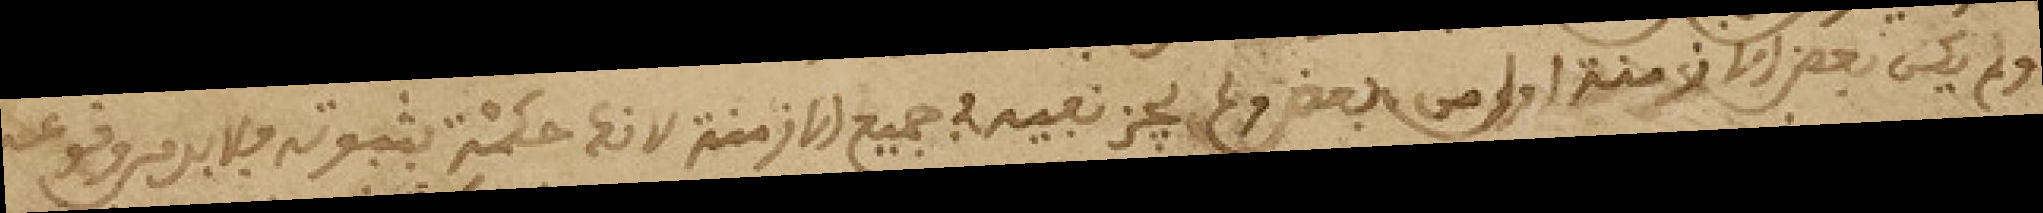ولم يكن بعض الازمنة أولى من بعض ولم يجز نفيه في جميع الازمنة لانك حكمته بثبوته فلا بد من وقوعه
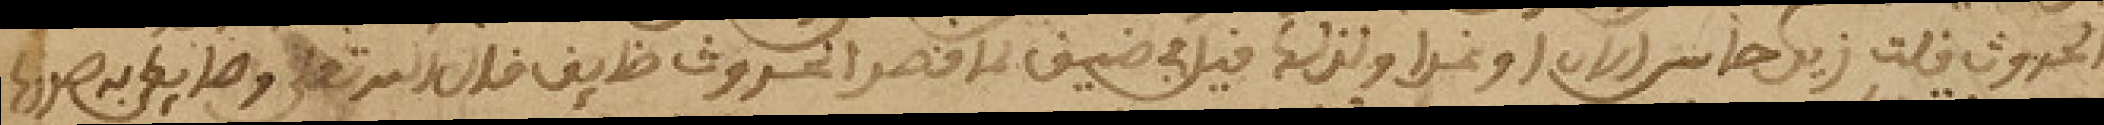الحدوث قلت زيد حاسن الان او غدا ولذلك قيل في ضيق لما قصد الحدوث ضائف قال الله تعلى وضائق به صدرك
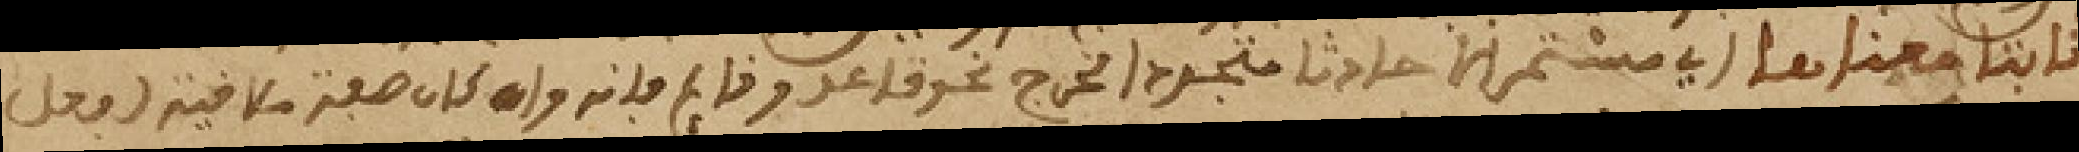ثابتا معناها اي مستمرا لا حادثا متجرد المخرج نحو قاعد وقائم فانه وان كان صفة ملاقية لفعل
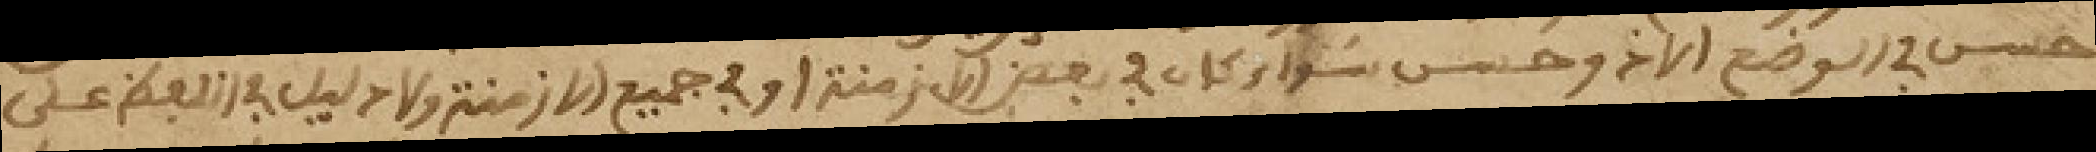حسن في الوضع الا ذو حسن سواء كان في بعض الازمنة او في جميع الازمنة ولا دليل في اللفظ على
